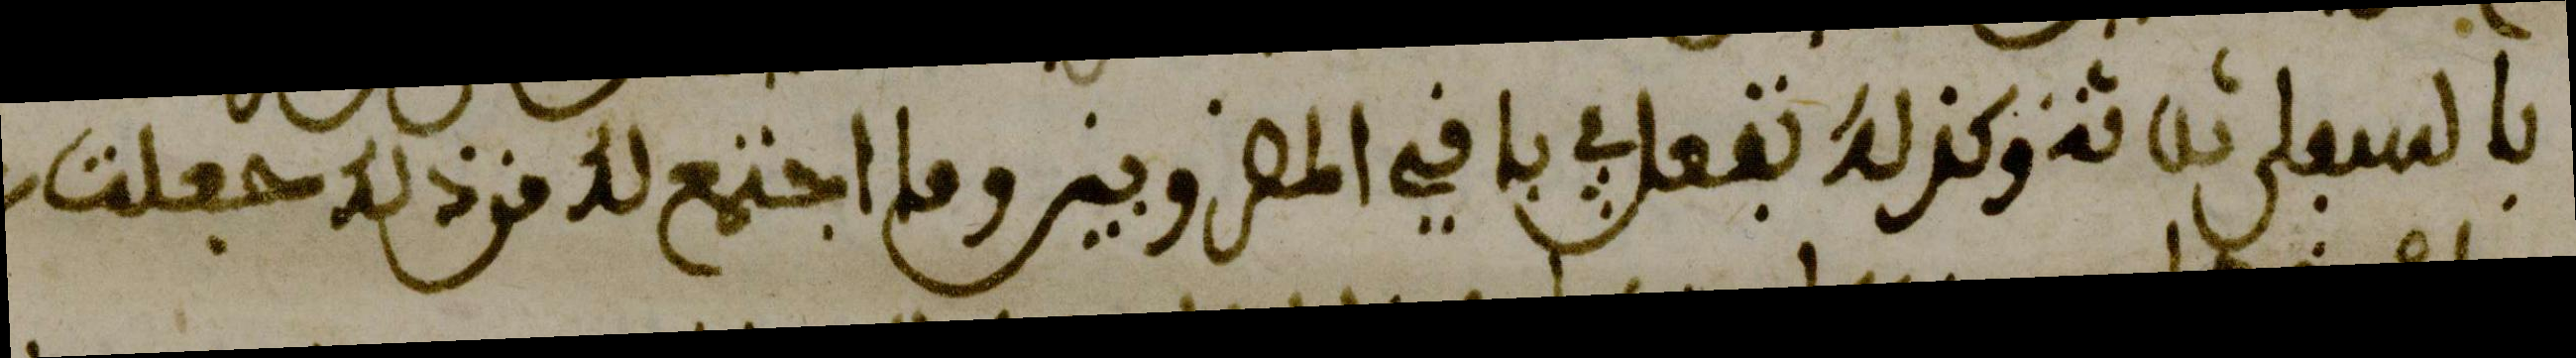بالسفلى ثلاثة و كذلك تفعل في باقي المضروبين و ما اجتمع لك من ذلك جعلت
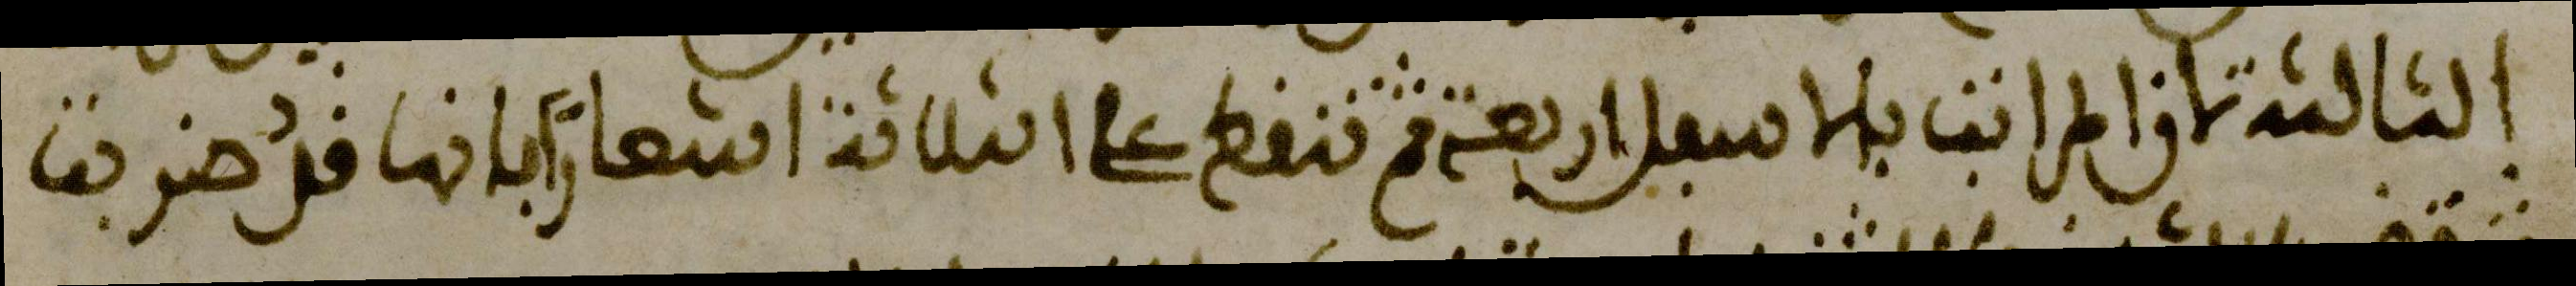الثالثة لان المراتب بالاسفل اربعة ثم تنقط على الثلاثة اشعارا بانها قد ضربت
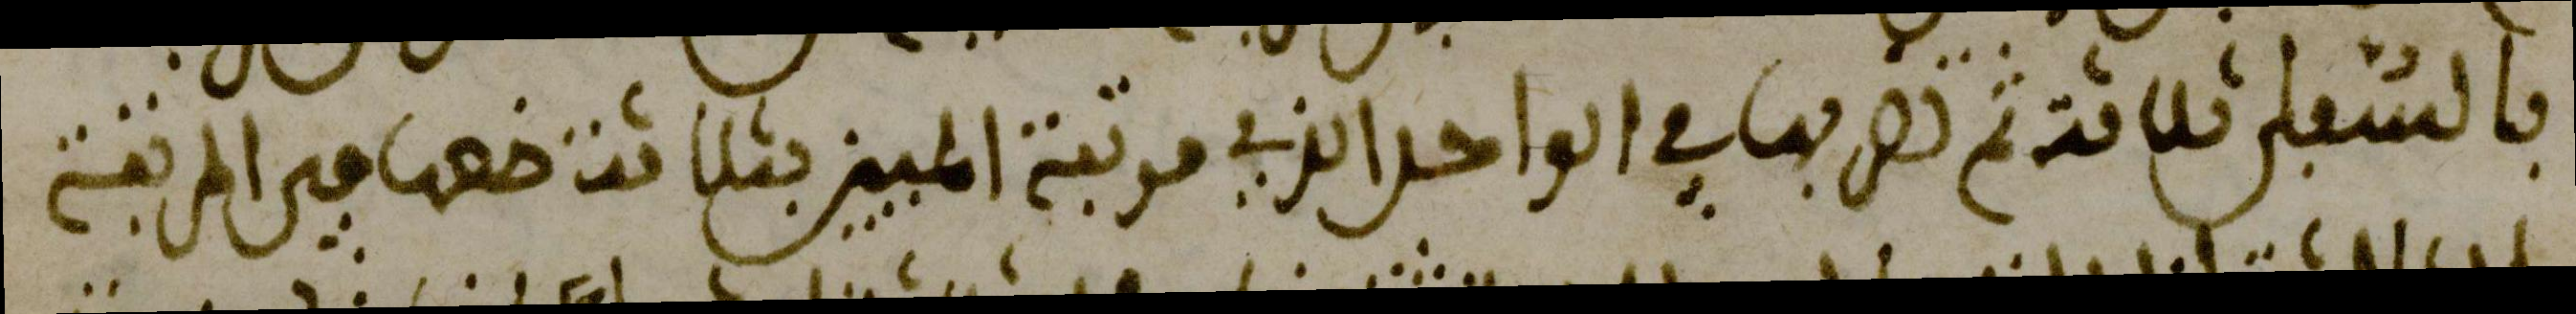بالسّفلى ثلاثة ثم تضرب في الواحد الذي مرتبة الميين بثلاثة ضعها في المرتبة
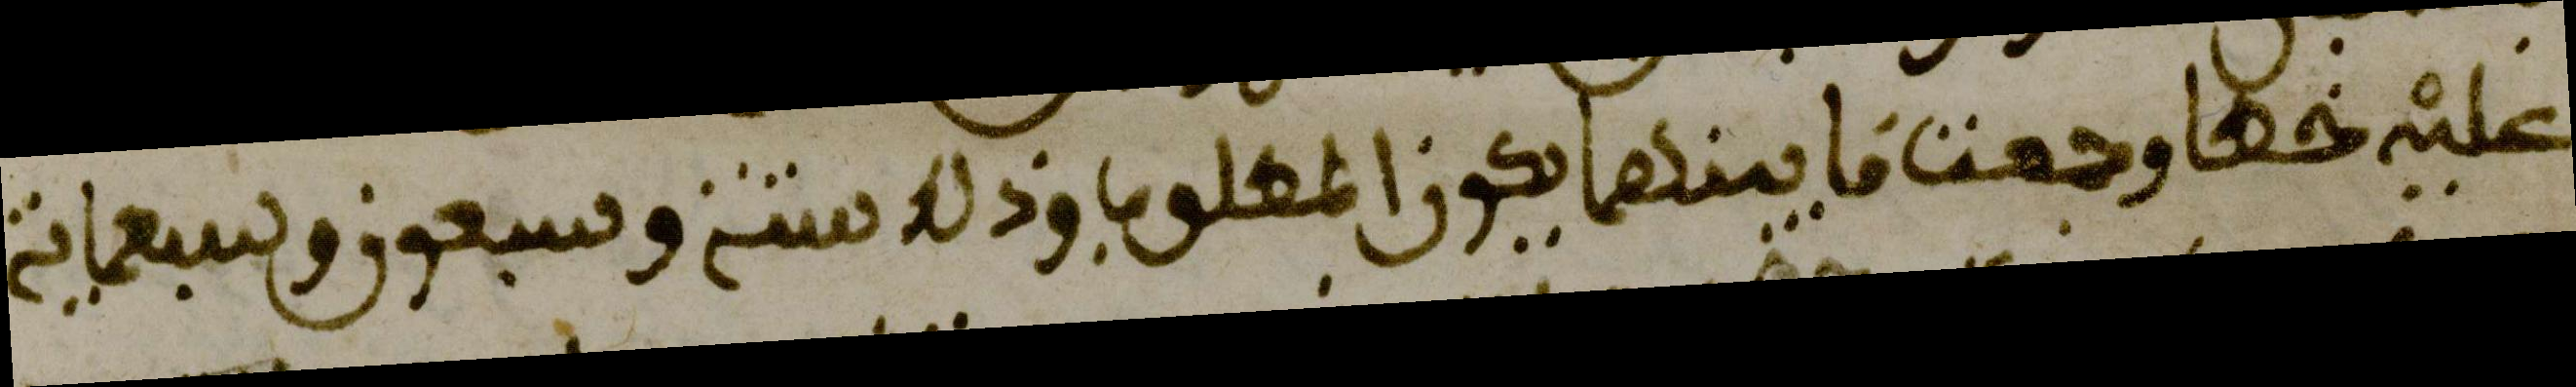عليه خطا و جمعت ما بينهما يكون المطلوب و ذلك ستة و سبعون و سبعماية
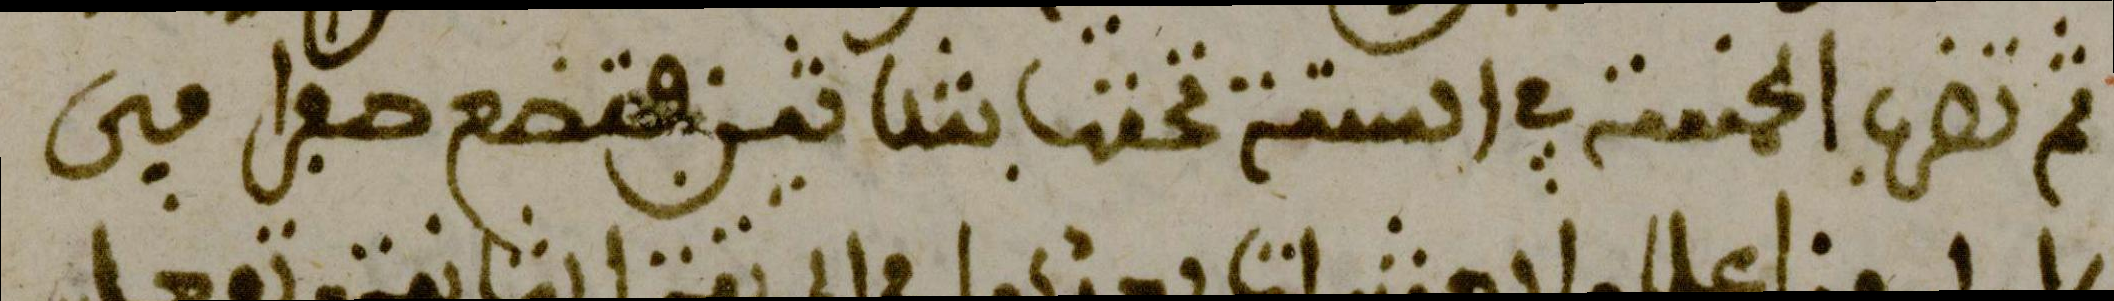ثم تضرب الخمسة في الستة تحتها بثلاثين فتضع صفرا في
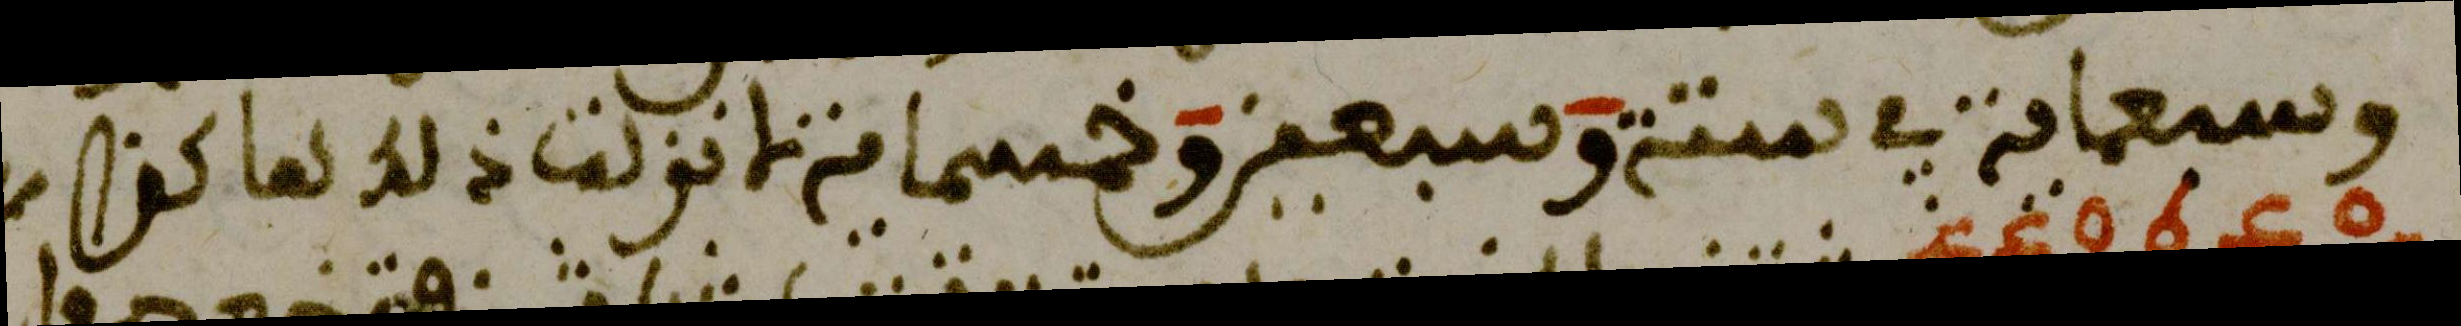و سبعماية في ستة و سبعين و خمسماية لانزلت ذلك هاكذا
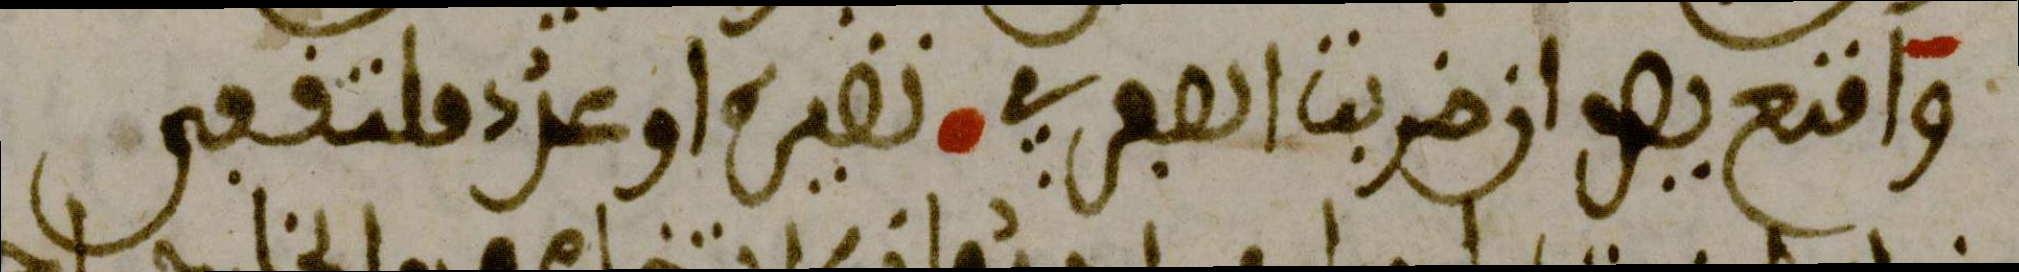و اقنع بصفران ضربت الصفر في نضيره او عدد فلتقتفي
